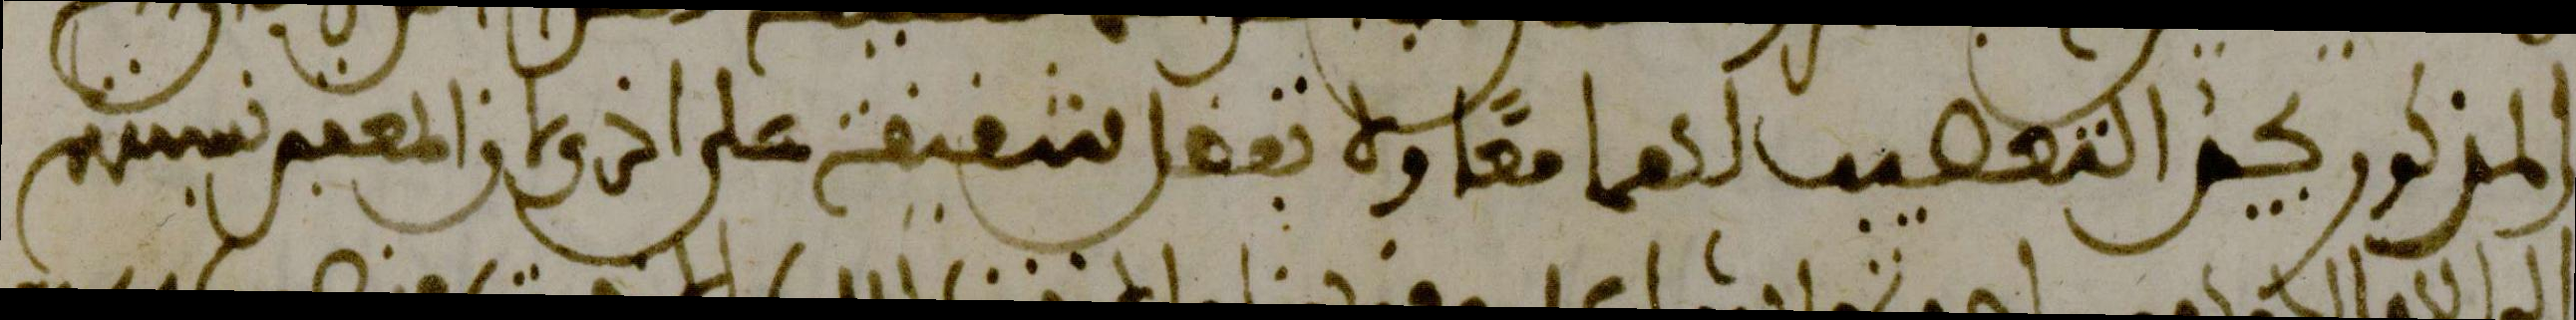المذكور يجر التعصيب لهما معًا ولا تفضل شقيقة على اخر ولان المعتبر نسبتهم
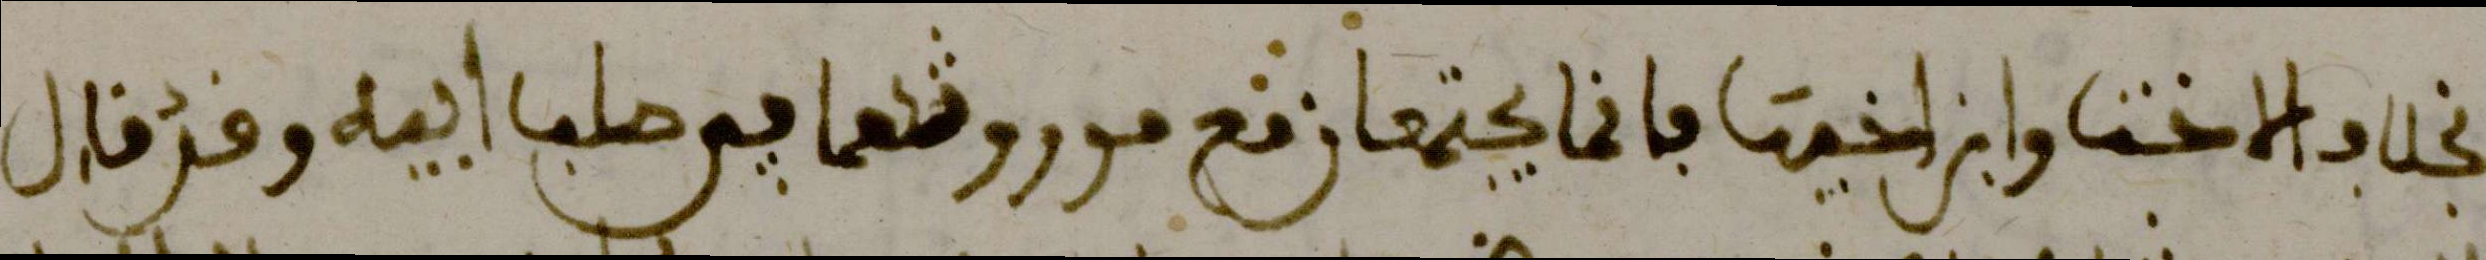بخلاف الاخت وابن اخيهَا فانما يجتمعان مع موروثهما في صلب ابيه وقد قال
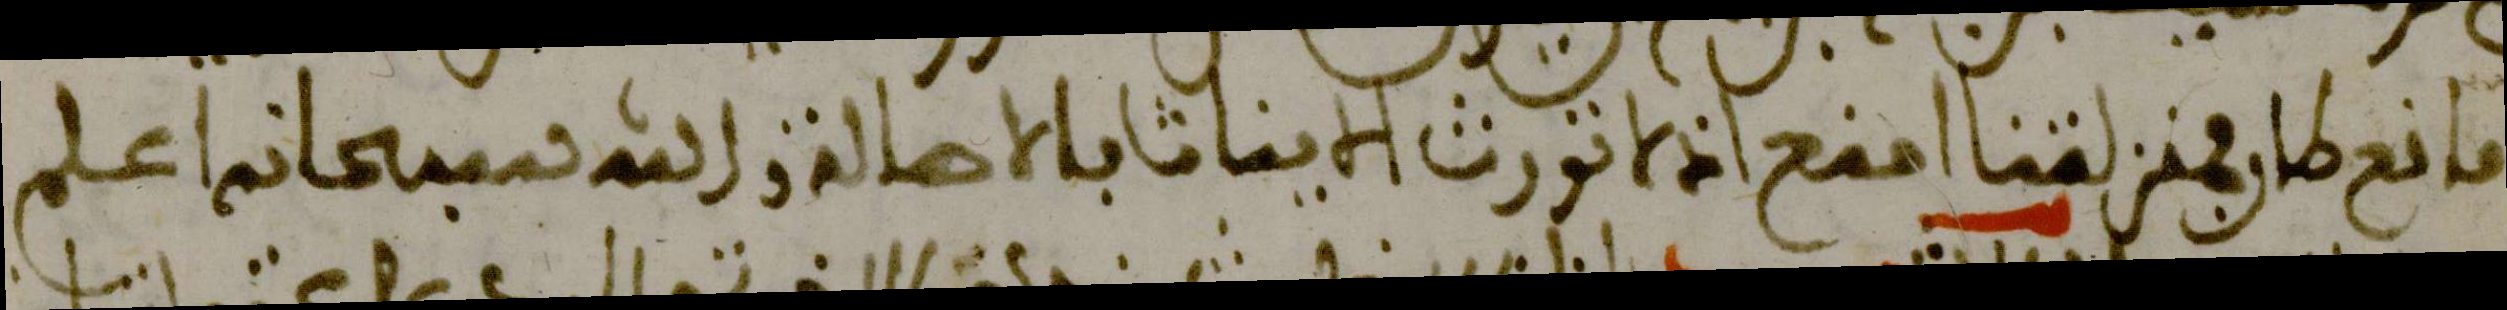مانع طار فمنزلتنا امنع اذ لا تورث الايناث فالاصالة والله سبحانه اعلم
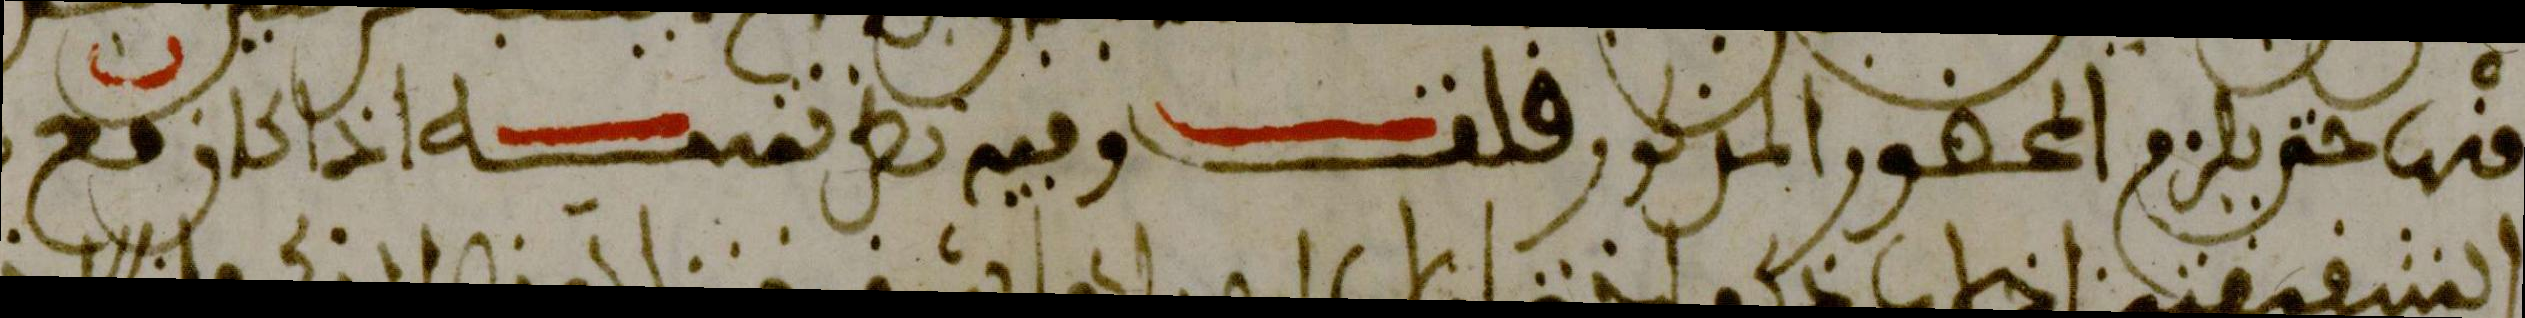منها حتى يلزم المحضور المذكور قلت وفيه نظر تنبيه اذا كان مع
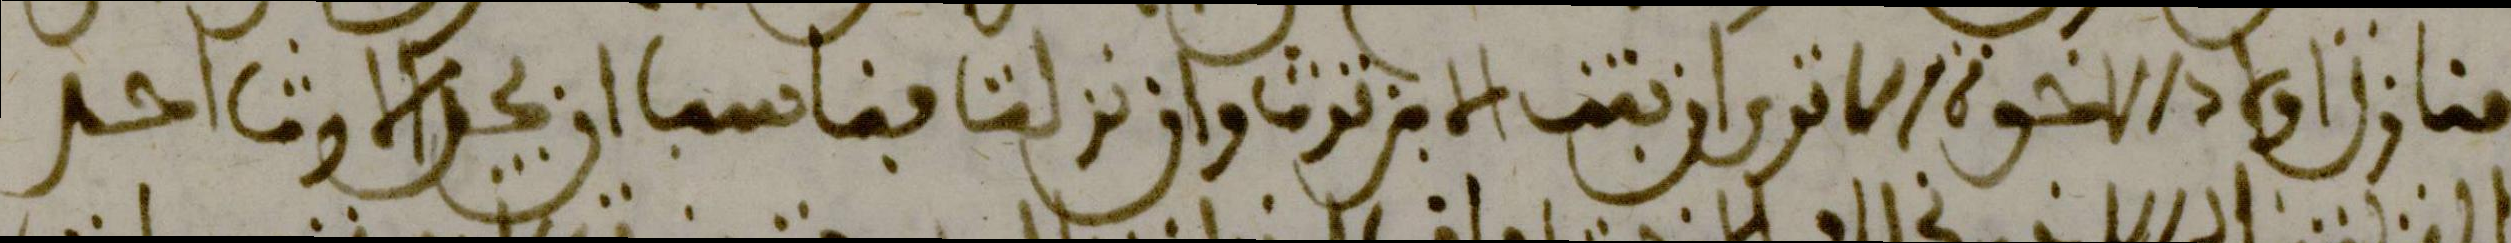منازل اولاد الاخوة الا ترى ان بنت الابن ترث وان نزلت فناسب ان يجر الارث احد
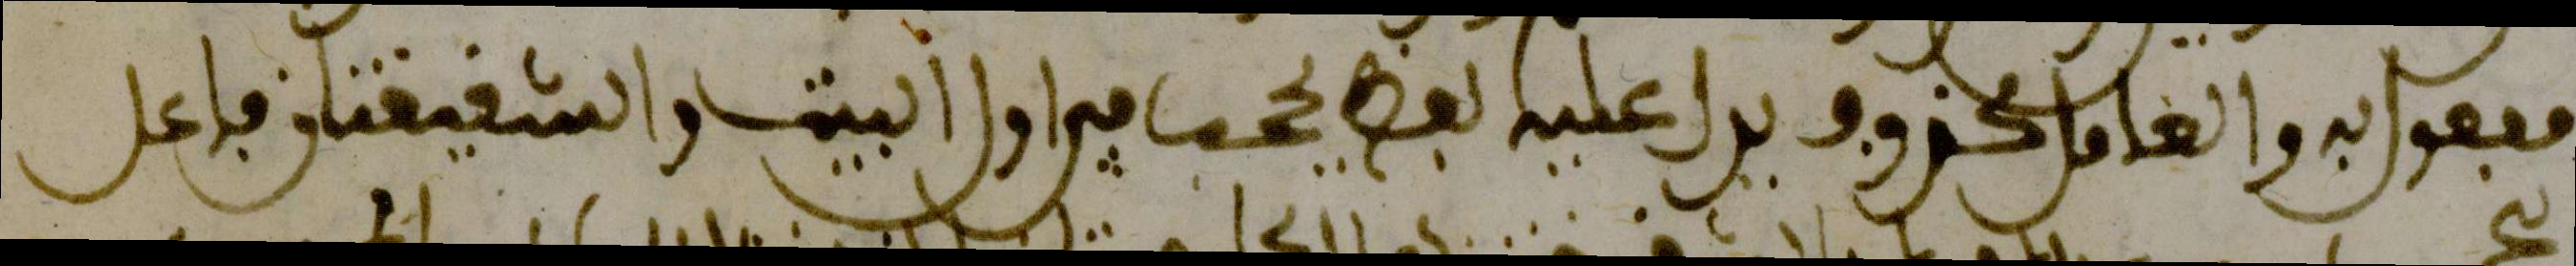مفعول به والعامل محذوف يدل عليه لفظ يحجب في اول البيت والشقيقتان فاعل
